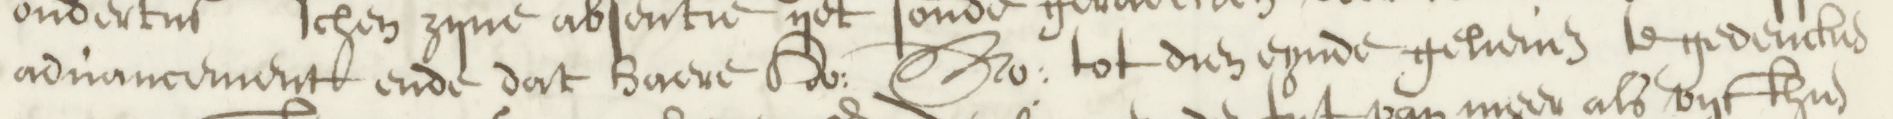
aduancement ende dat haere Ho:Mo: tot dien eynde gelieuen te gedencken
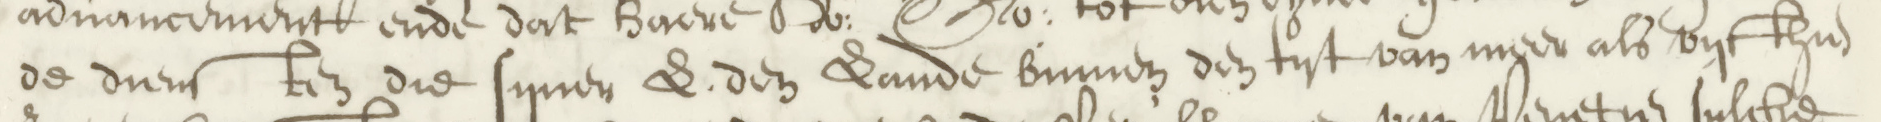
de diensten die syner L. den Lande binnen den tyt van meer als vyfthien
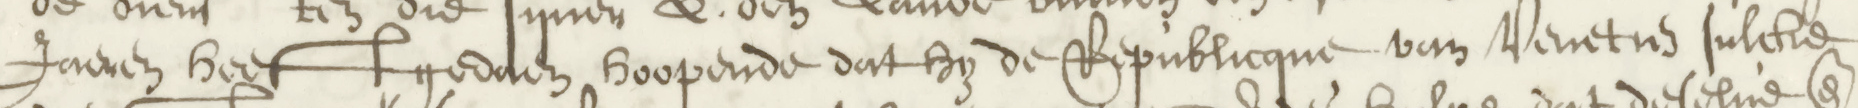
Jaeren heeft gedaen hoopende dat hy de Republicque van Venetien sulcke
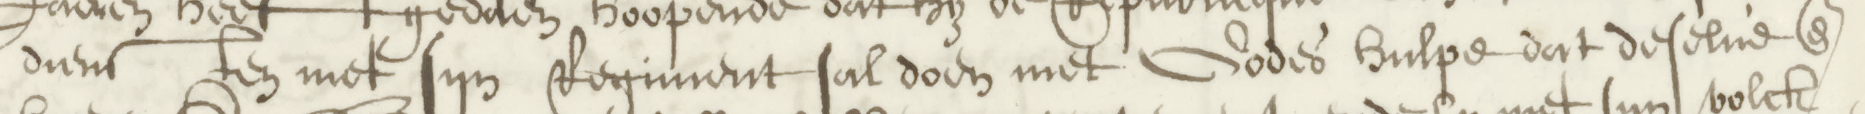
diensten met zijn Regiment sal doen met Godes hulpe dat deselue &
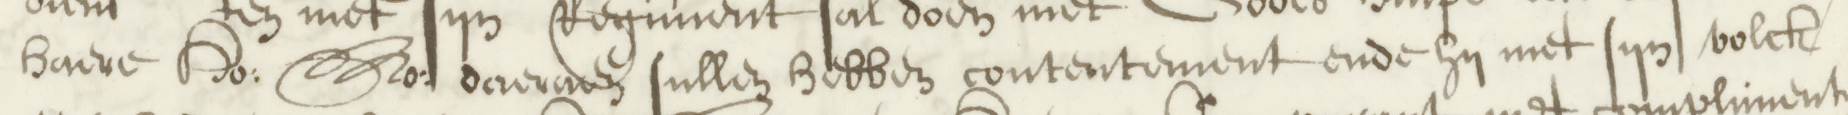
haere Ho:Mo: daeraen sullen hebben contentement ende hy met syn volck
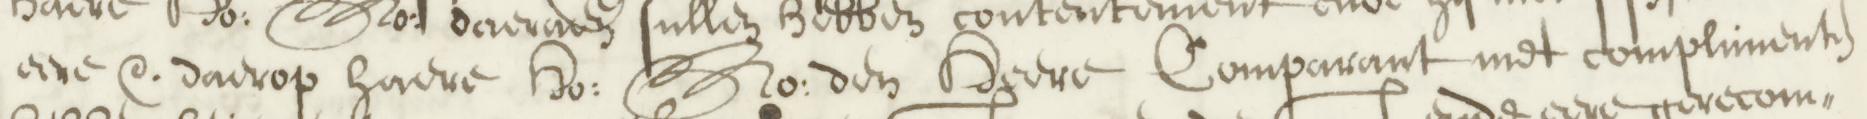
eere & daerop haere Ho:Mo: den heere Comparant met complimenten
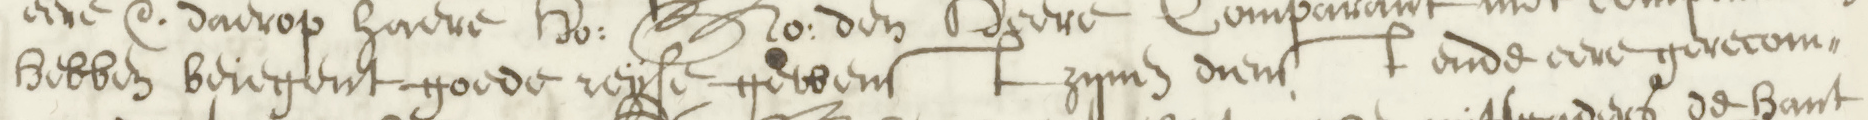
hebben beiegent goede reijse gewenst zynen dienst ende eere gerecom„
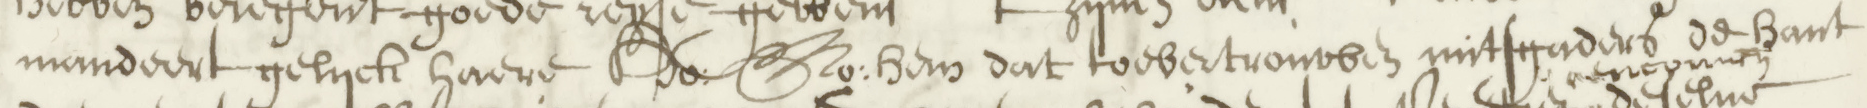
mandeert gelyck haere Ho:Mo: hem dat toevertrouwen mitsgaders de hant
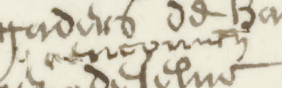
,, aencomen
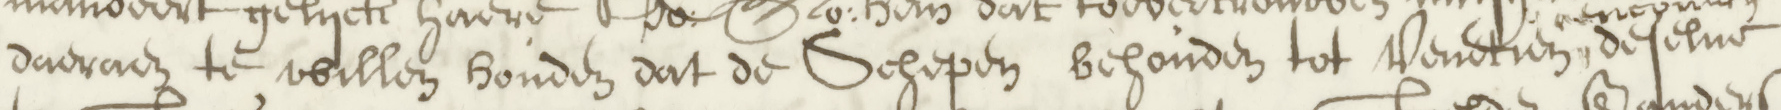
daeraen te willen houden dat de Schepen behouden tot Venetien ,, deselue
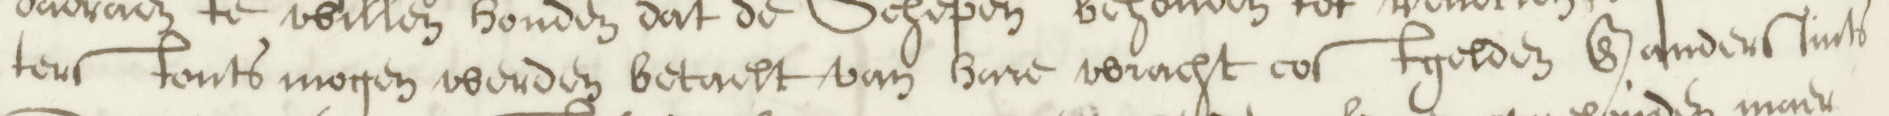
terstonts mogen werden betaelt van hare vracht costgelden & anderssints
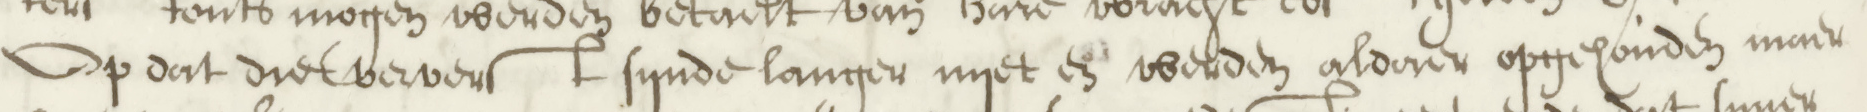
Op dat diet ververst synde langer nyet en werden aldaer opgehouden maer
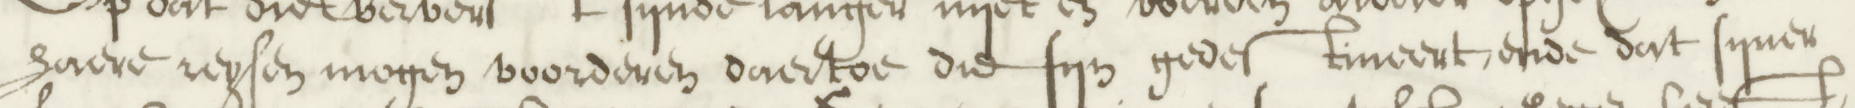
haere reysen mogen voorderen daertoe die syn gedestineert, ende dat syner
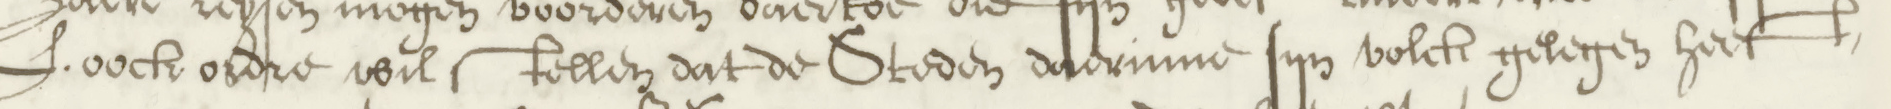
L. oock ordre wil stellen dat de Steden daerinne syn volck gelegen heeft,
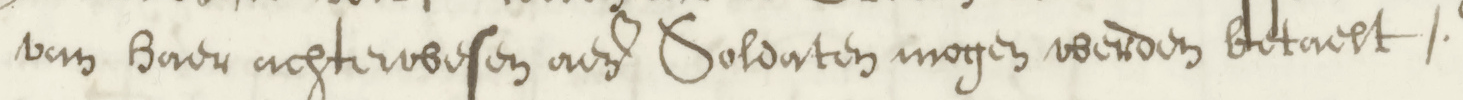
van haer achterwesen aen Soldaten mogen werden betaelt.
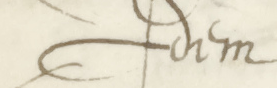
Idem
